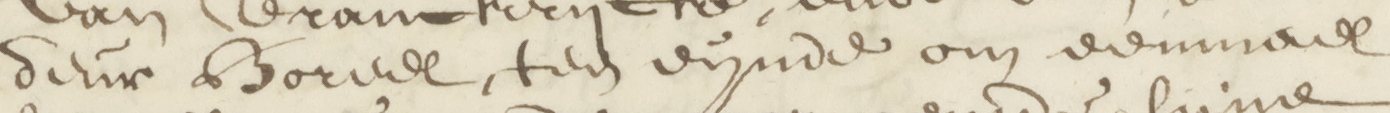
deur Boreel, ten eijnde om eenmael
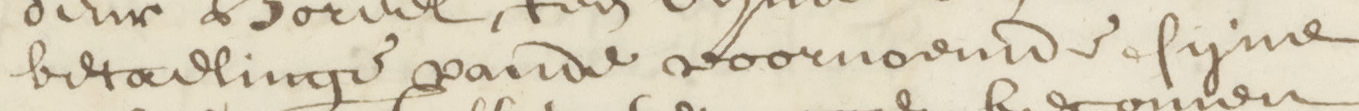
betaelinge vande voornoemde sijne
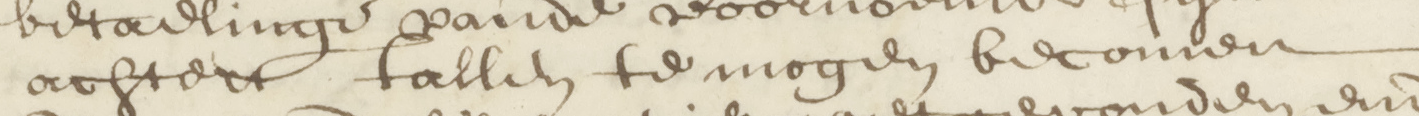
achterstallen te mogen becomen:
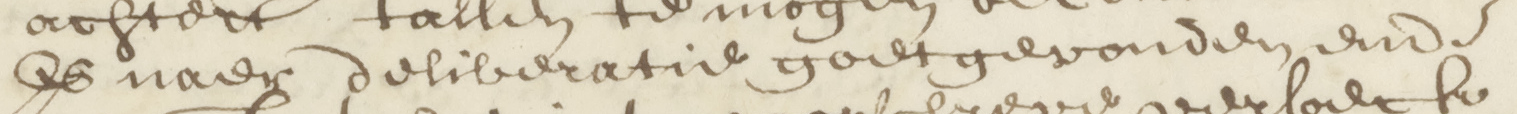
Is naer deliberatie goetgevonden ende
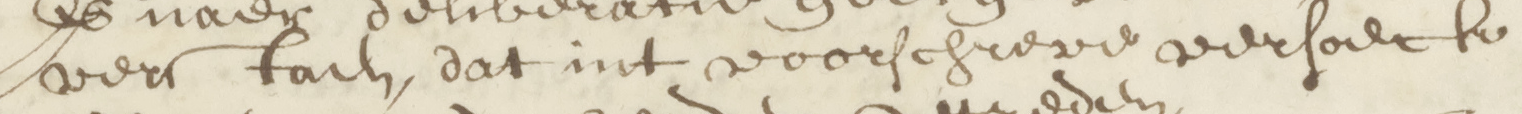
verstaen, dat int voorschreve versoeck
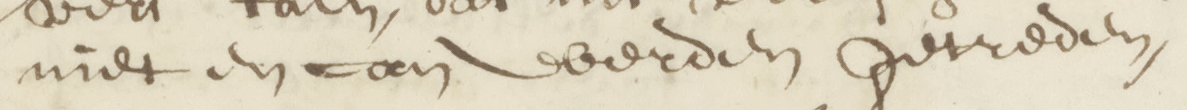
niet en can werden getreden.
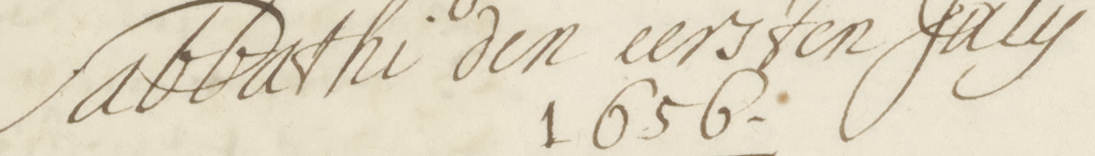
Sabbathi den eersten Julij
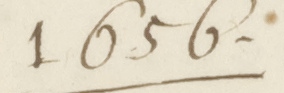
1656.
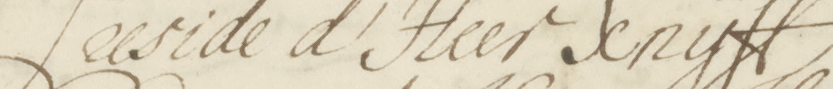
Preside d‛Heer Knijff
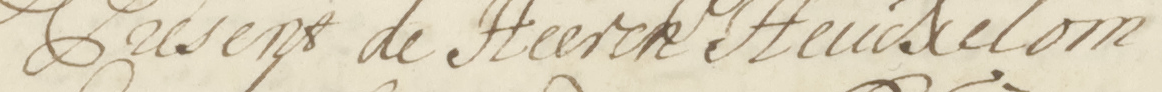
Presens de Heeren Heuckelom
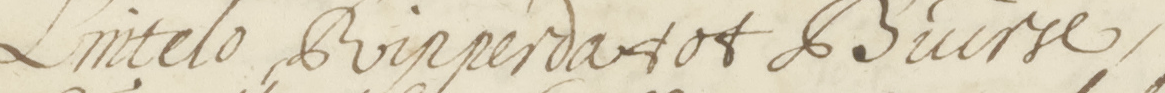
Lintelo, Rippera tot Buirse
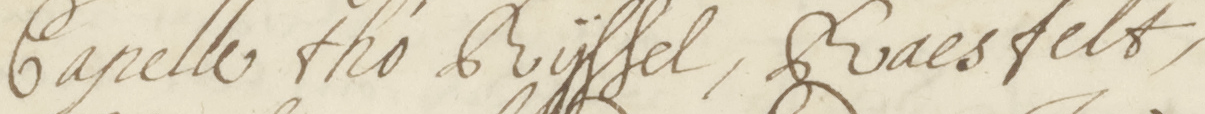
Capelle tho Rijssel, Raesfelt,
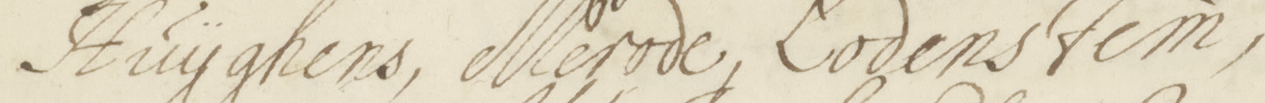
Huijghens, Merode, Lodenstein,
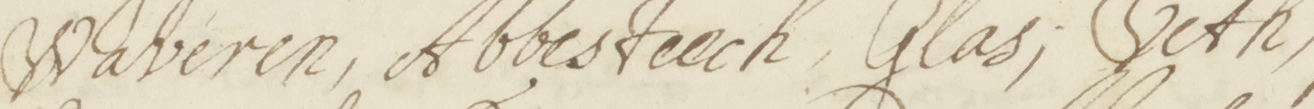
Waveren, Abbesteech, Glas, Veth,
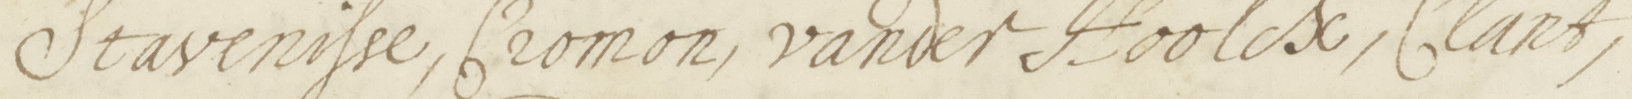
Stavenisse, Cromon, van der Hoolck, Clant.
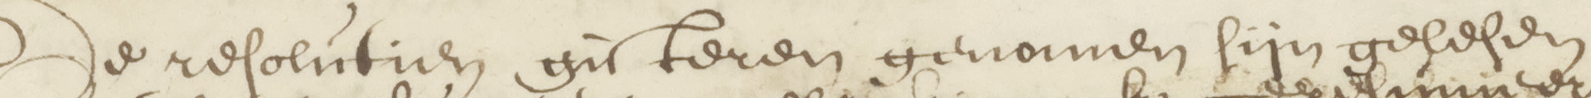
De resolutien gisteren genomen sijn gelesen
